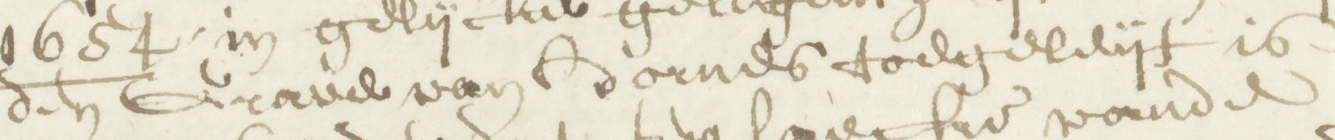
den Grave van Hornes toegeleijt is
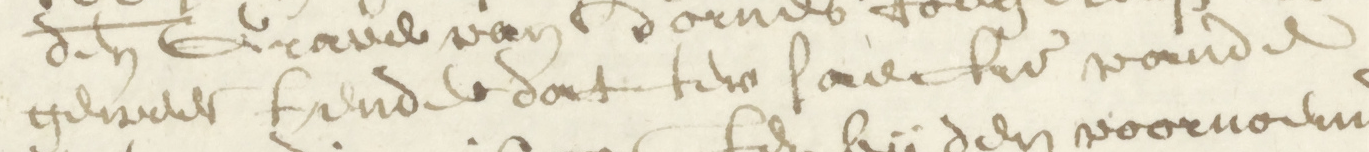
geweest, ende dat ter saecke vande
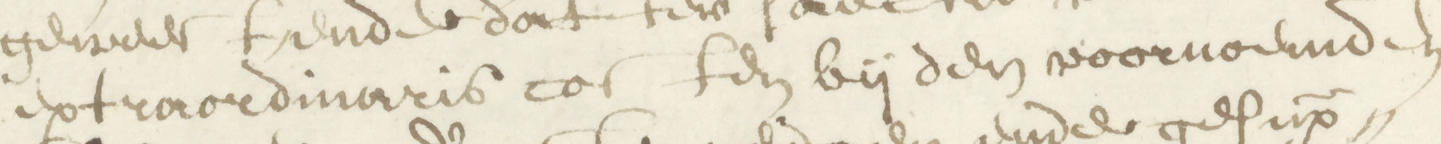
extraordinaris costen bij den voornoemden
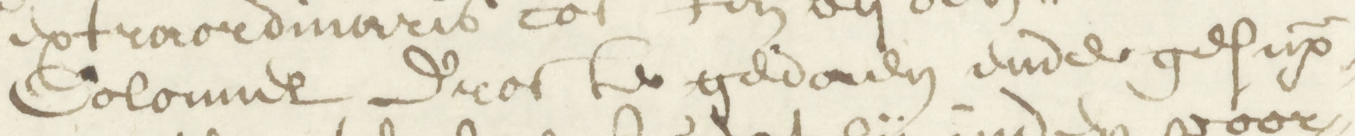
Colonnel Droste gedaen ende gesup„
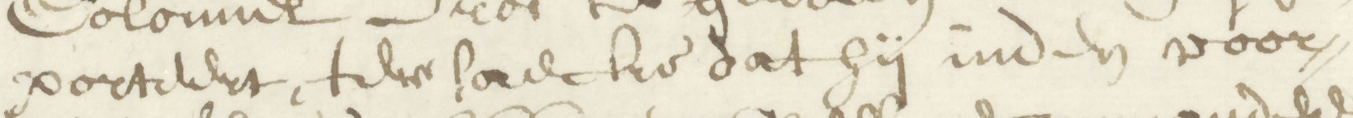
porteert, ter saecke dat hij inden voor„
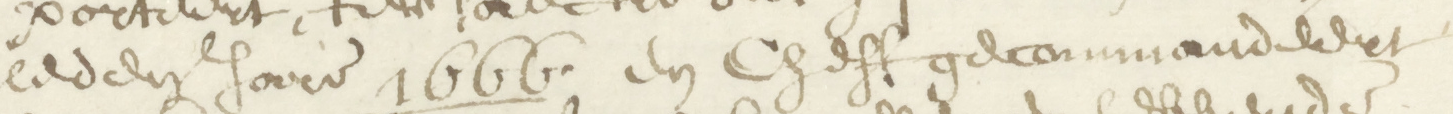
leden Jare 1666. en Cheff gecommandeert
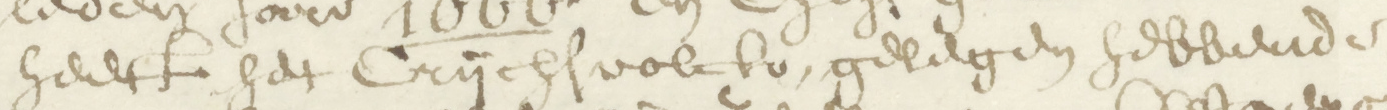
heeft het Crijchsvolck, gelegen hebbende
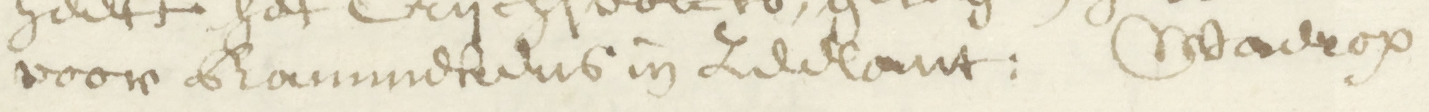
voor Rammekens in Zeelant: Waerop
